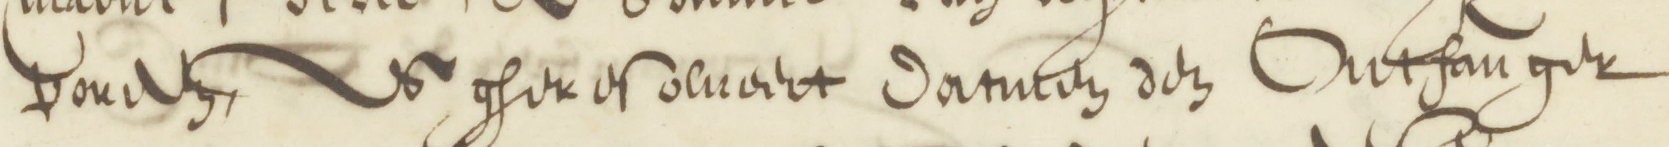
ponden, es gheresolueert datmen den Ontfanger
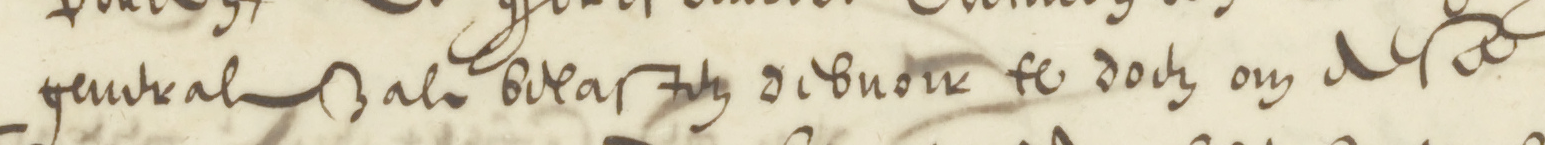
general zal belasten debuoir te doen om dese
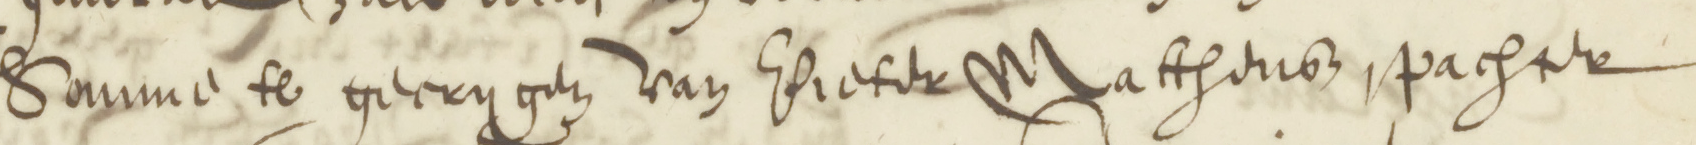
Somme te gecrygen van Pieter Mattheus, pachter
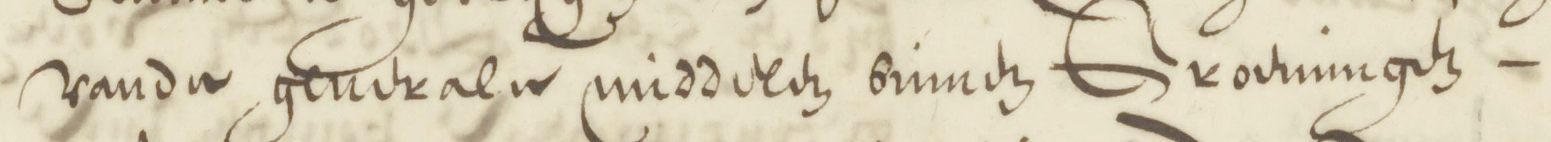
vande generale middelen binnen Groeningen —
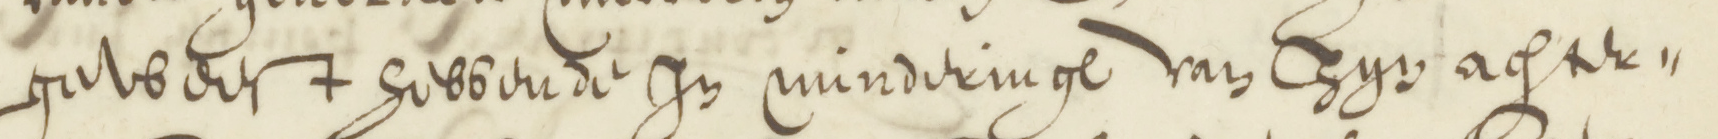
geweest hebbende in minderinge van zyn achter„
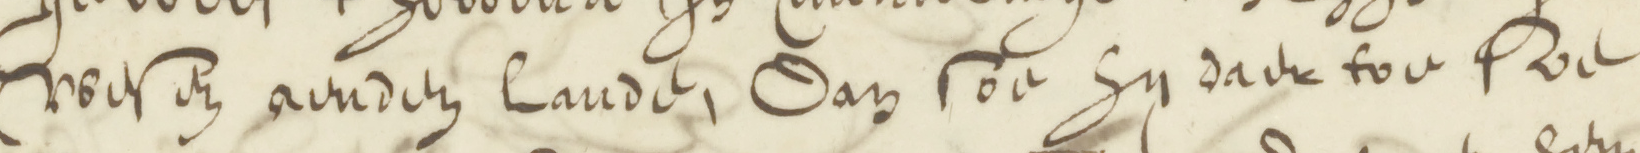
wesen aenden Lande, Om soe hy daer toe soe
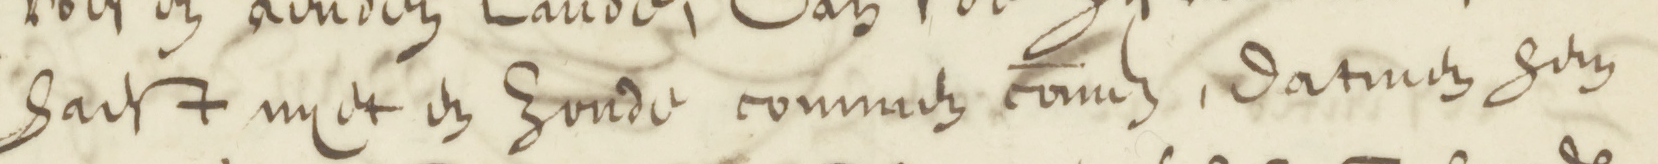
haest nyet en zoude commen comen, datmen hem
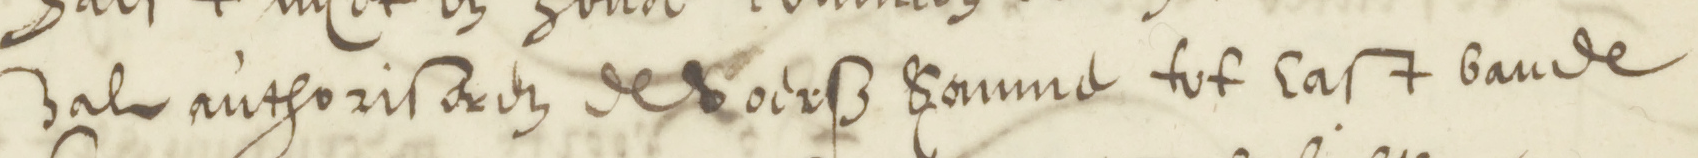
zal authoriseren de voers Somme tot last vande
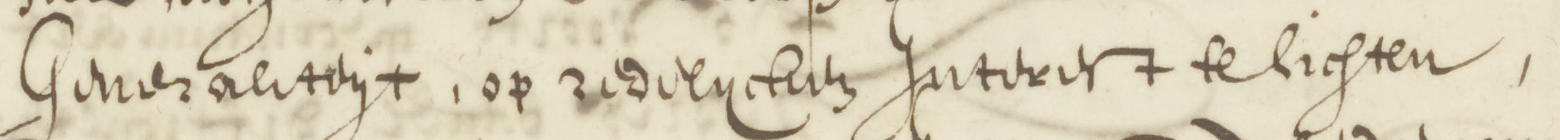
Generaliteyt, op redelycken Interest te lichten,
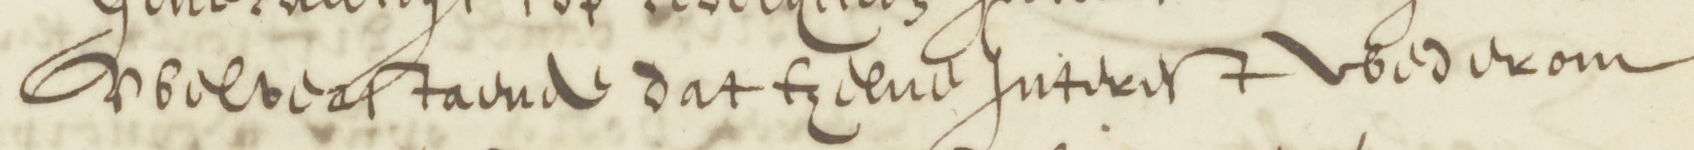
welverstaende dat tzelve Interest wederom
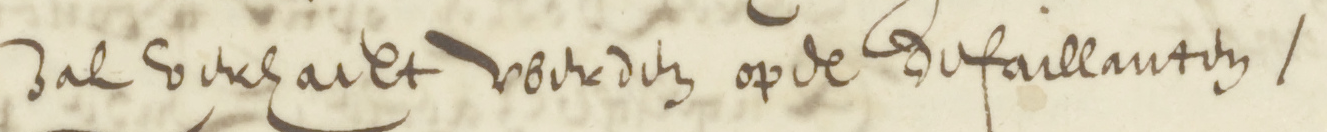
zal verhaelt werden opde defaillanten
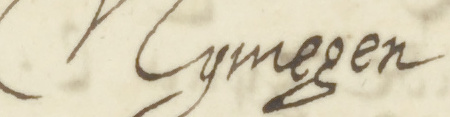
Nymegen
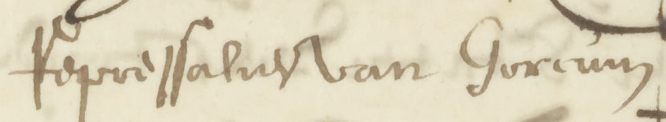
Repressalien van Gorcum
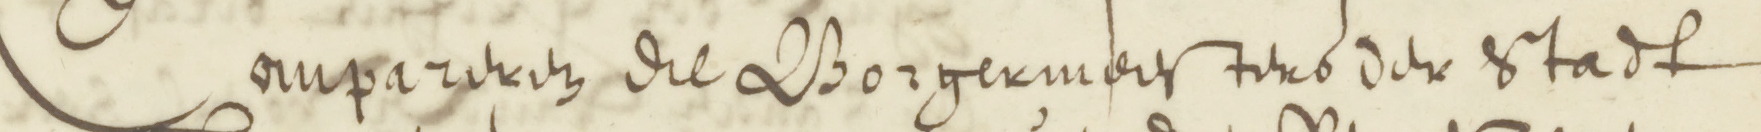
Compareren de Borgermeesters der Stadt
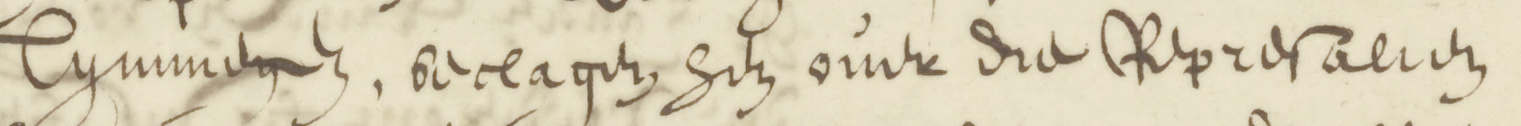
Nymmegen, beclagen hen ouer die Represalien
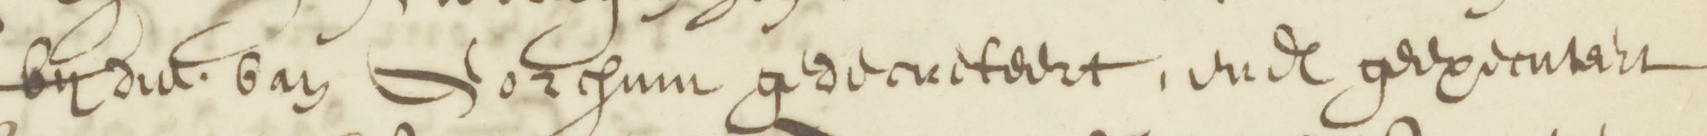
by die van Gorchum gedecreteert, ende geexecuteert
